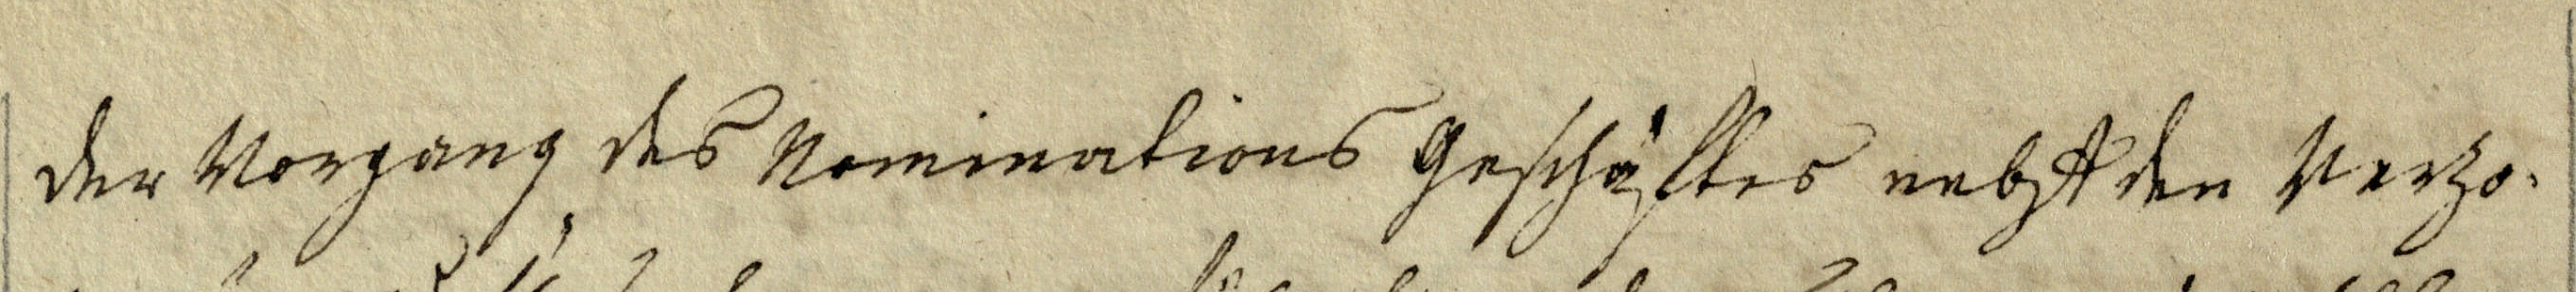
der Vorgang des Nominations Geschäftes nebst den Verzö¬.
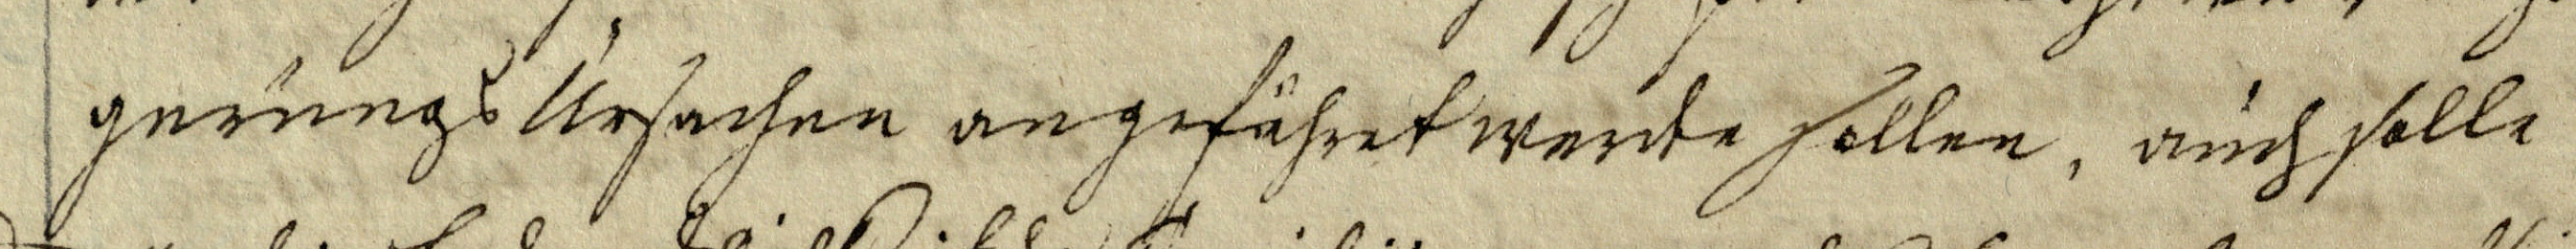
gerungs Ursachen angeführet werden sollen, auch solle
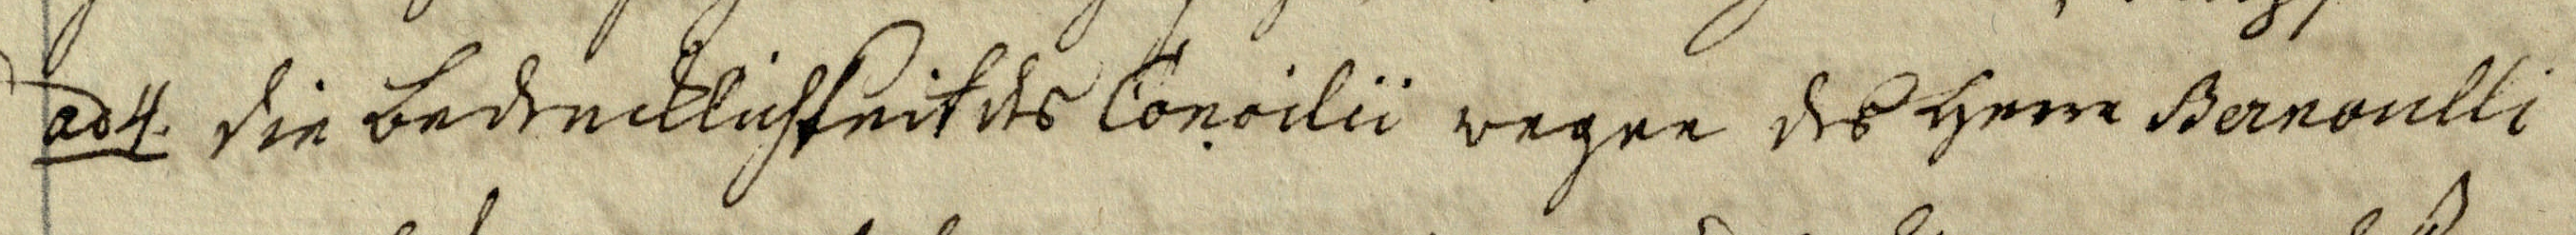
ad 4. die Bedenklichkeit des Concilii wegen des Herrn Bernoulli
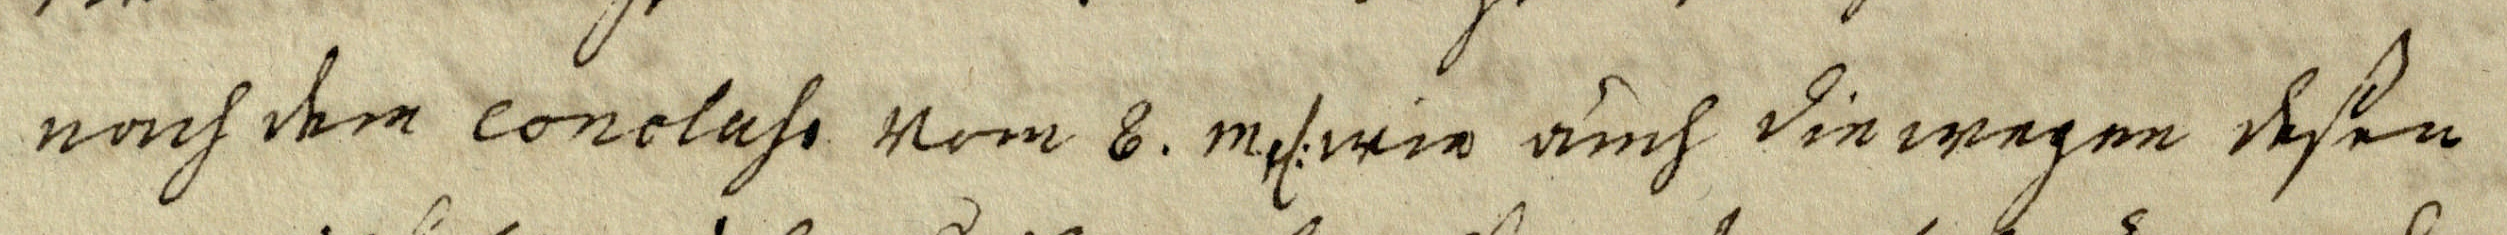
nach dem Concluso vom 8. m. et wie auch die wegen deßen
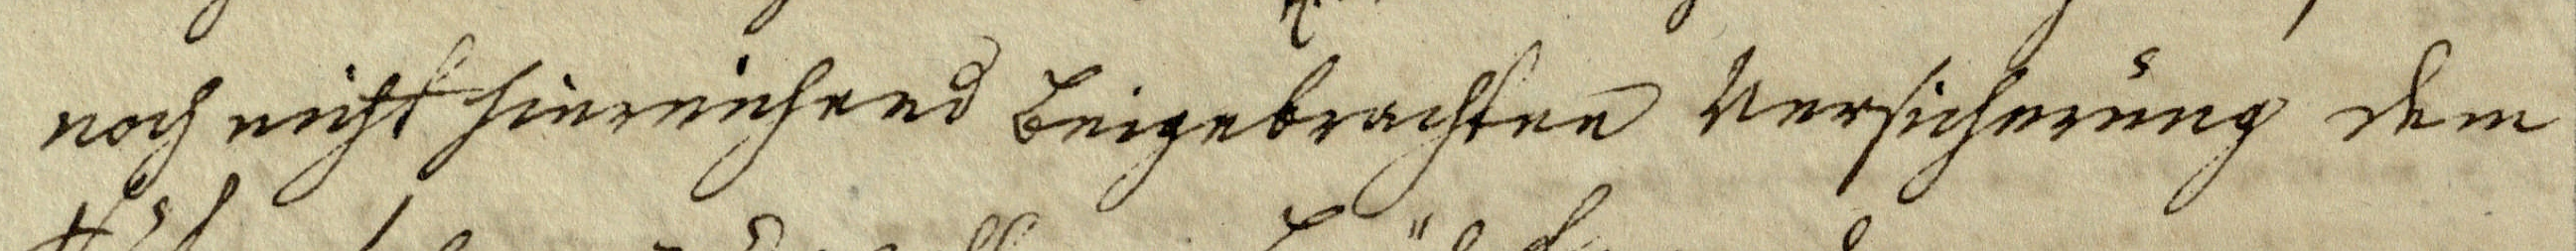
noch nicht hinreichend beigebrachten Versicherung dem
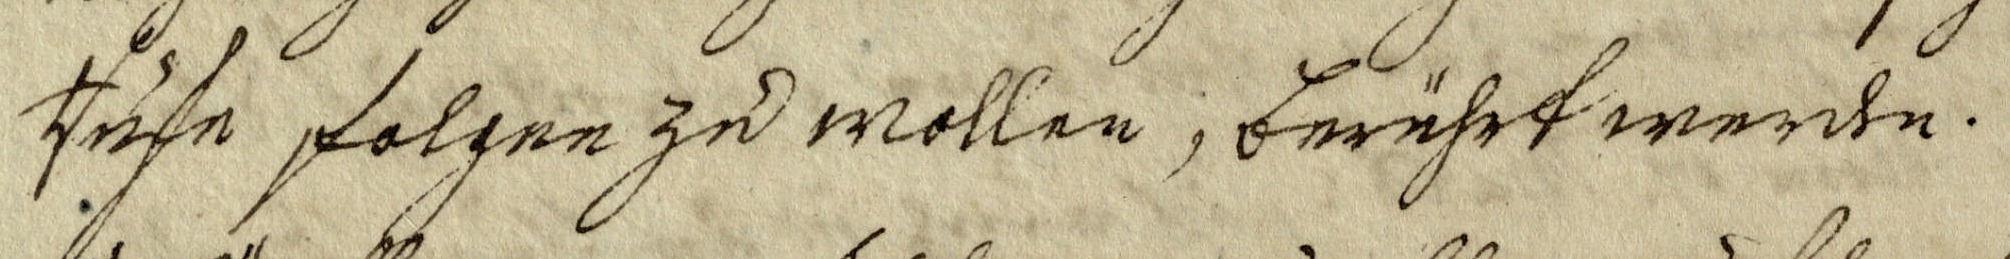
Rufe folgen zu wollen, berührt werden.
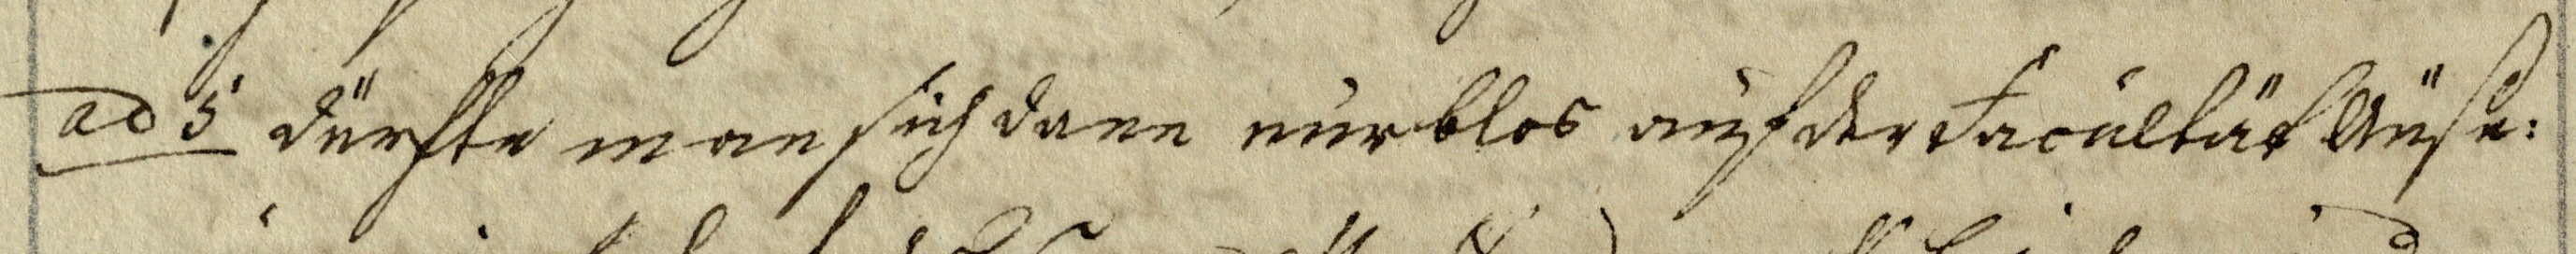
ad 5 dürfte man sich dann nur blos auf der Facultät Äuße¬
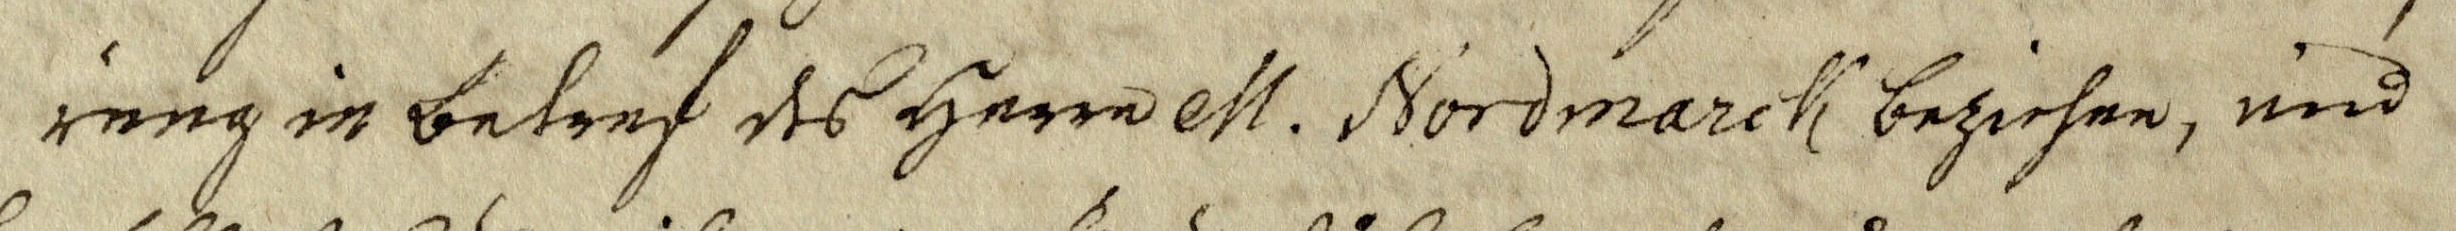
rung in Betref des Herrn M. Nordmarck beziehen, und
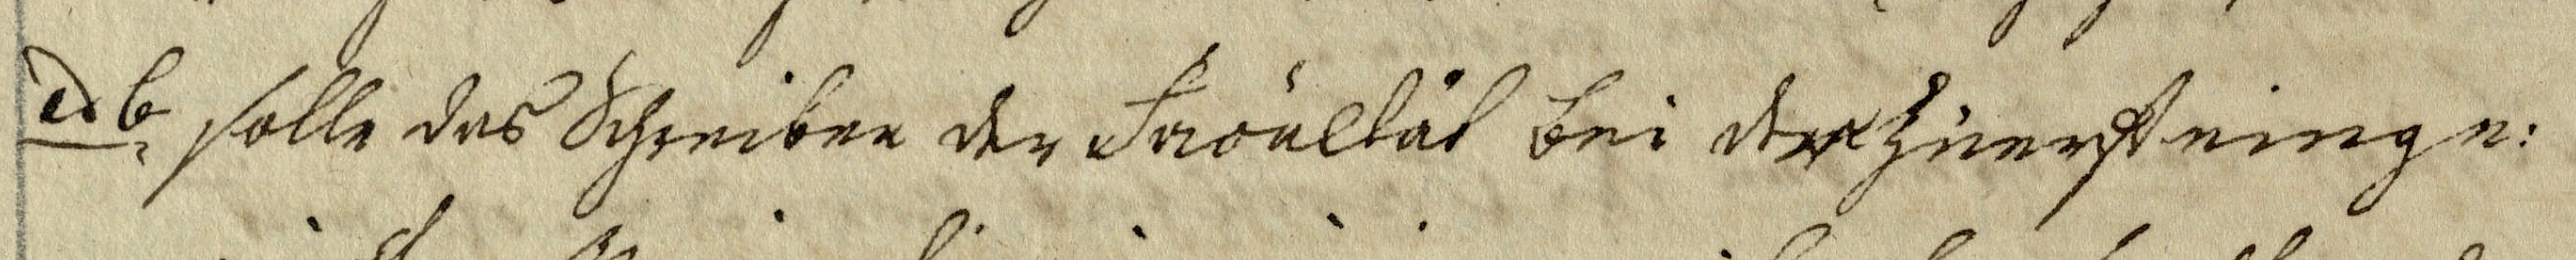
ad 6 solle das Schreiben der Facultät bei der zuerst einge¬
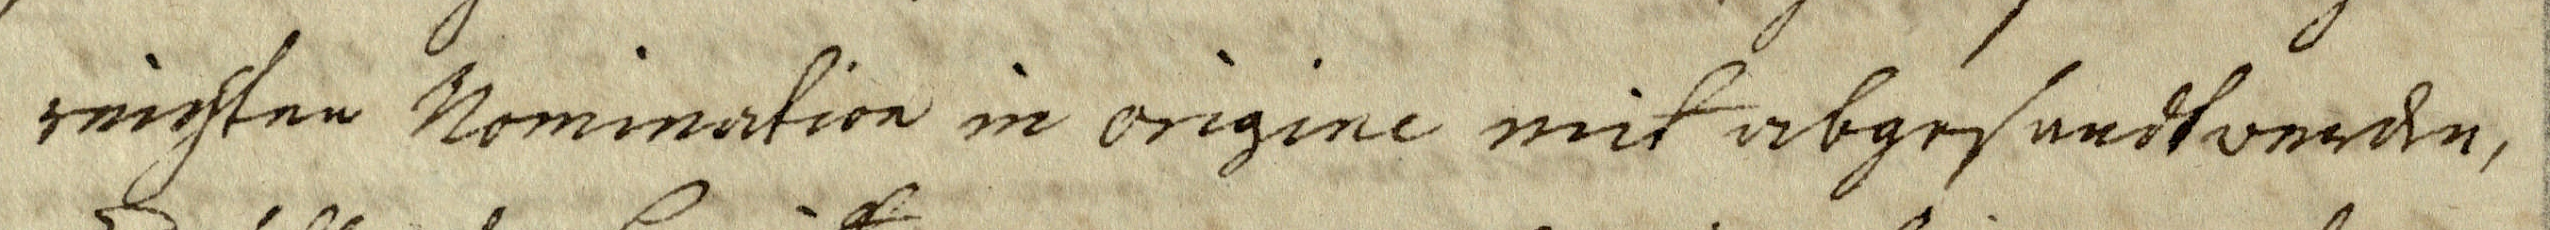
reichten Nomination im origine mit abgesandt werden,
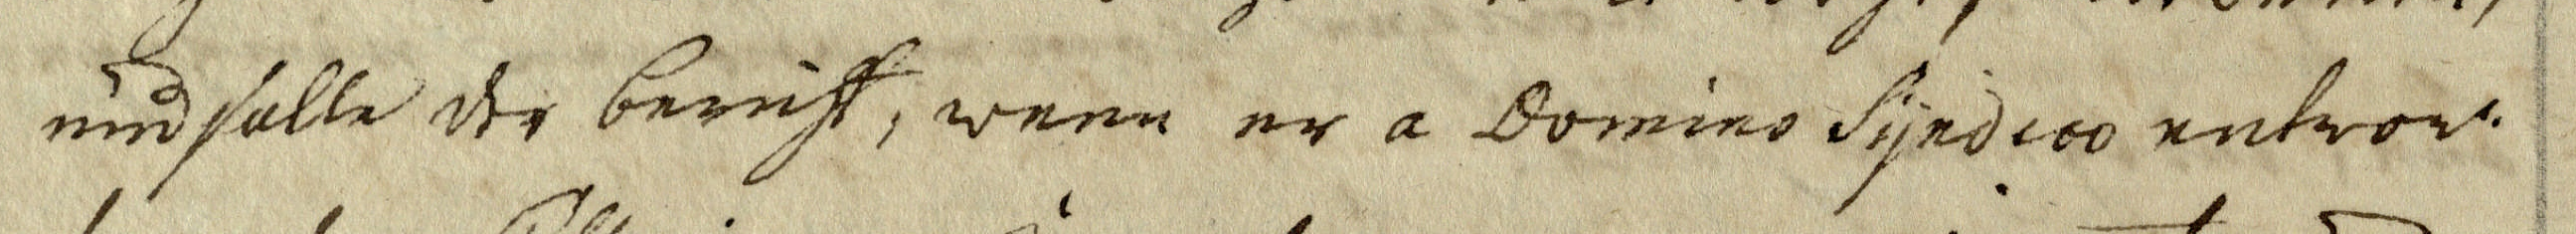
und solle der Bericht, wenn er a Domini Sÿndico entwor¬
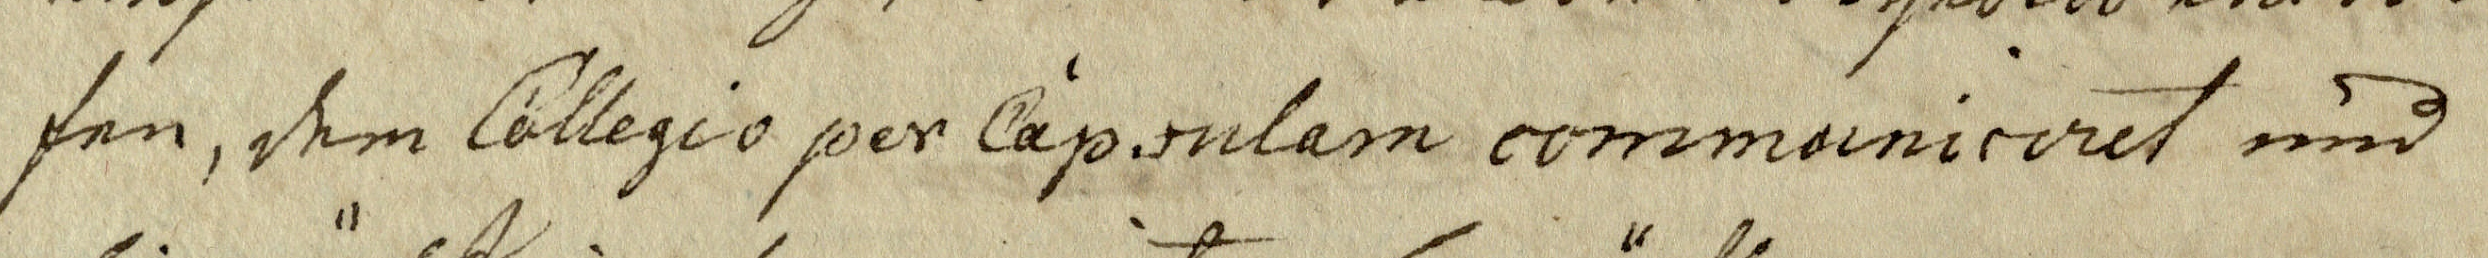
fen, dem Collegio per Capsulam communiciret und
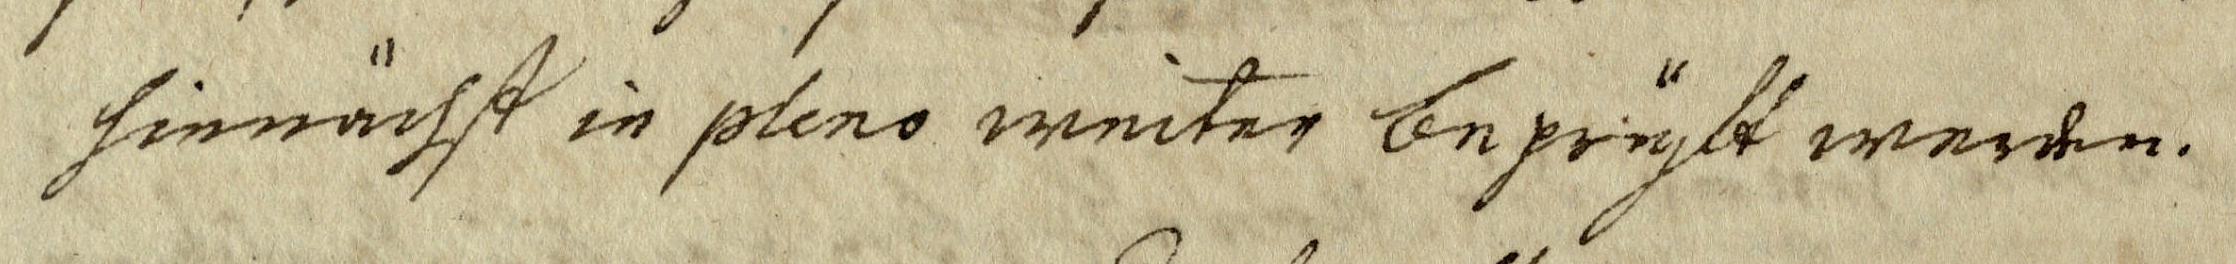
hienächst in pleno weiter beprüft werden.
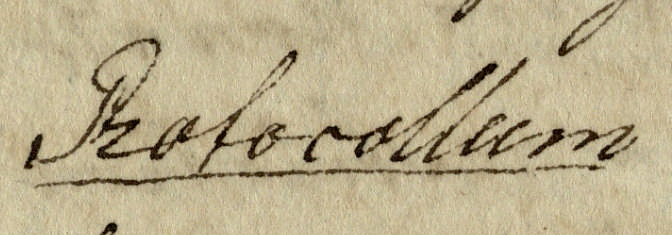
Protocollum
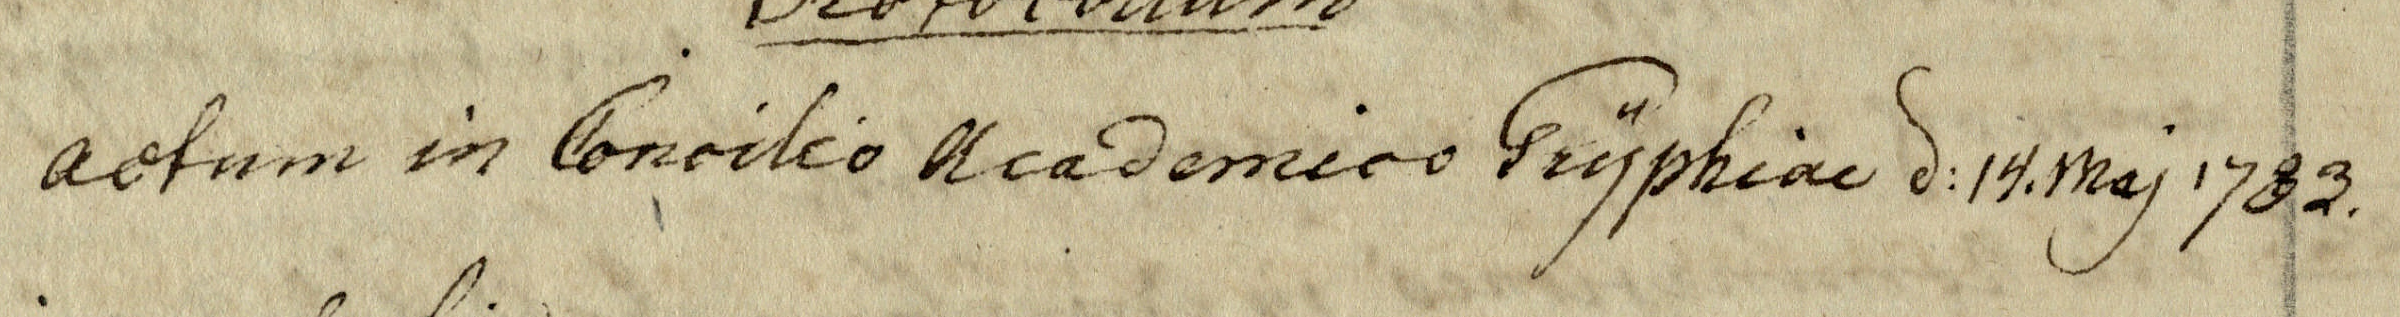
Actum in Concilio Academico Grÿphiae d. 14. Maj 1783.
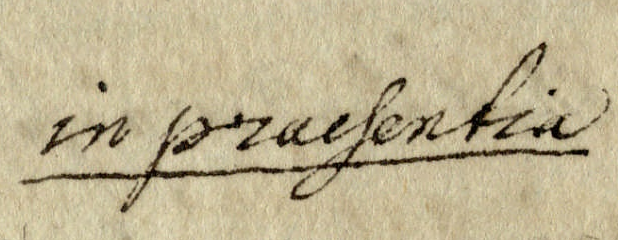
in praesentia
